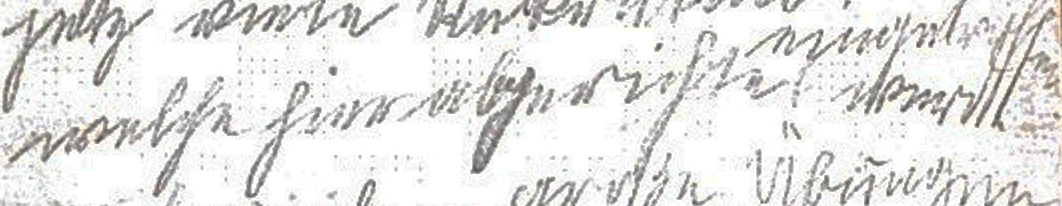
welche hier abgerichtet xx xx
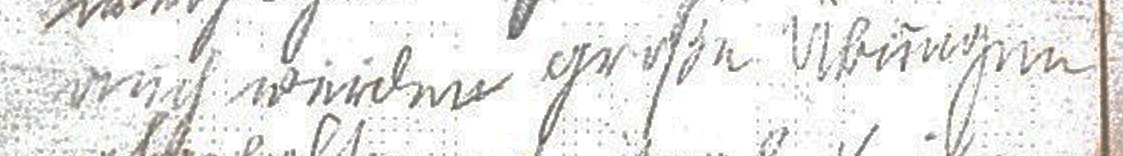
auch werden große Übungen
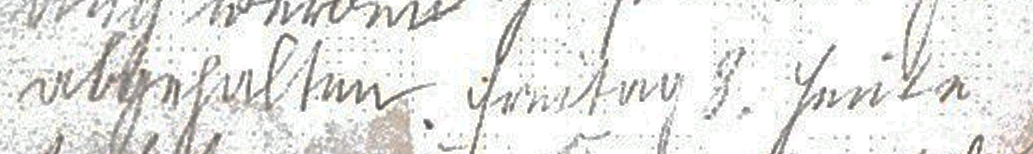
abgehalten. Freitag 8. Heute
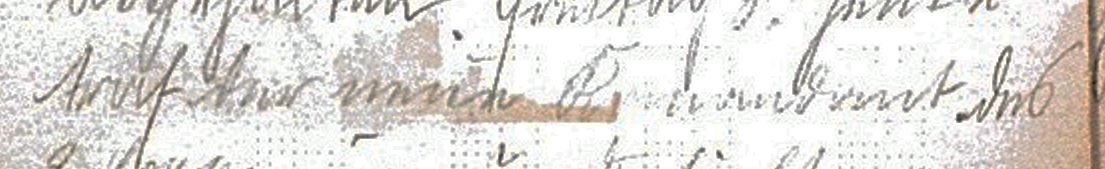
traf hier ein Reservist des
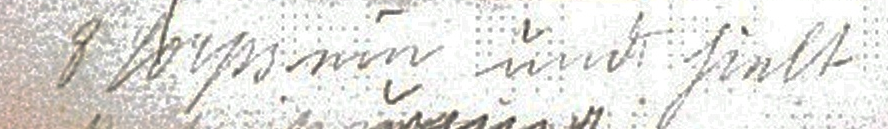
8. Corps ein und hielt
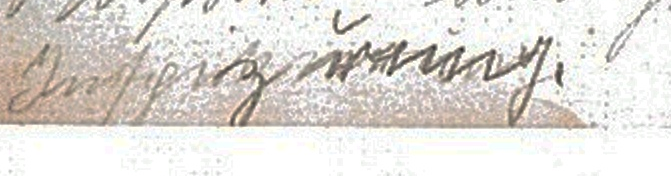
Inspizierung.
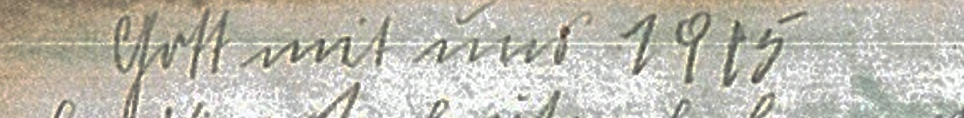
Gott mit uns 1915
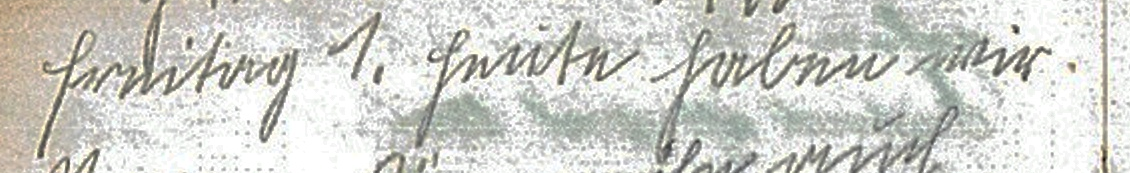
Freitag 1. Heute haben wir
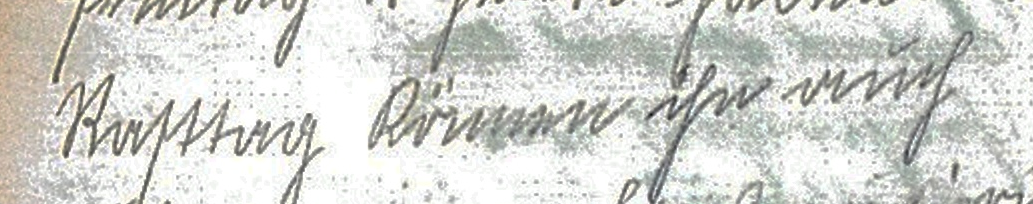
Rasttag. Können ihn auch
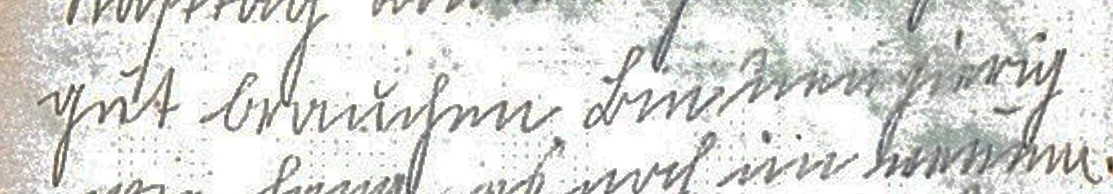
gut brauchen. Bin neugierig
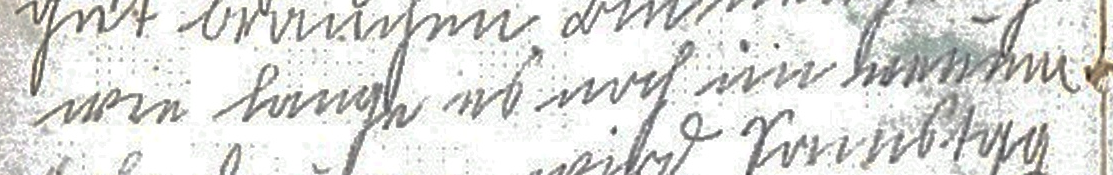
wie lange es noch im neuen
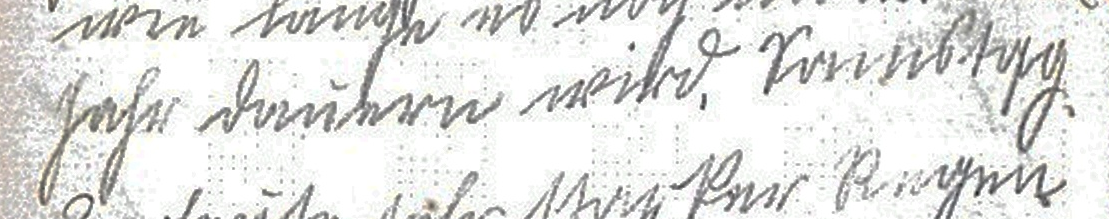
Jahr dauern wird. Samstag
